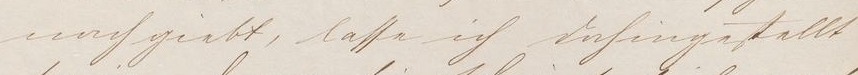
nachgiebt, lasse ich dahingestellt
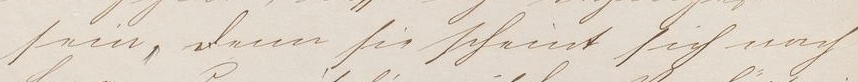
sein, denn sie scheint sich nach
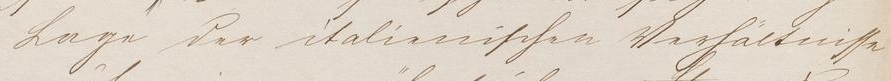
Lage der italienischen Verhältnisse
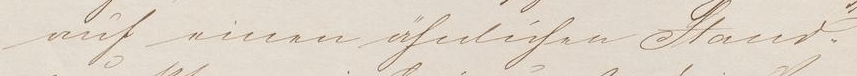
auf einen ähnlichen Stand-
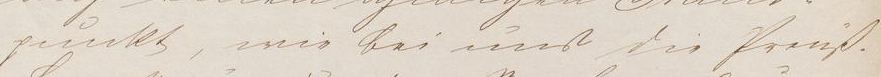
punkt wie bei uns die Preuß.
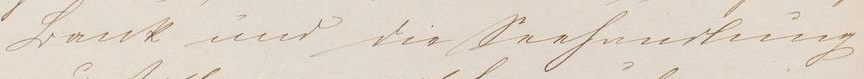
Bank und die Seehandlung
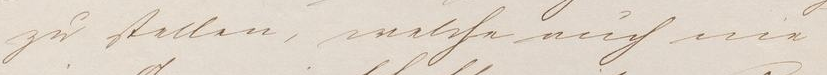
zu stellen, welche auch nie
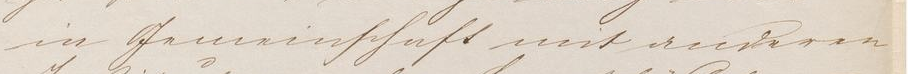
in Gemeinschaft mit anderen
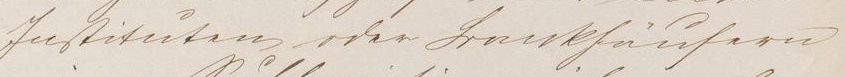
Instituten oder Bankhäusern
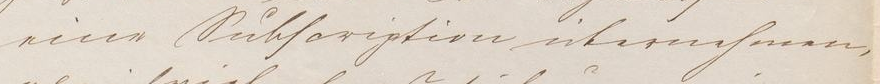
eine Subscription übernehmen,
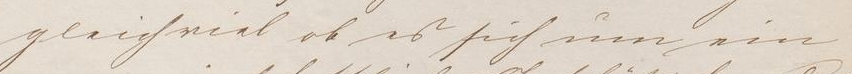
gleichviel ob es sich um ein
